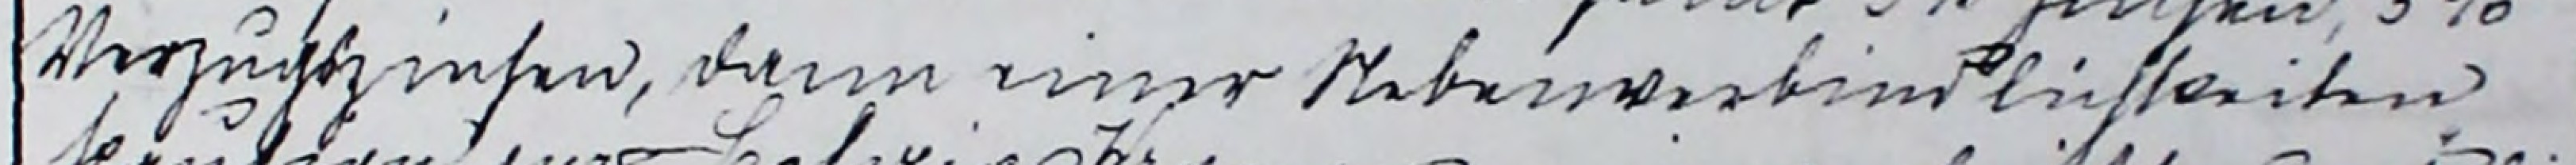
Verzugszinsen, dann einer Nebenverbindlichkeiten
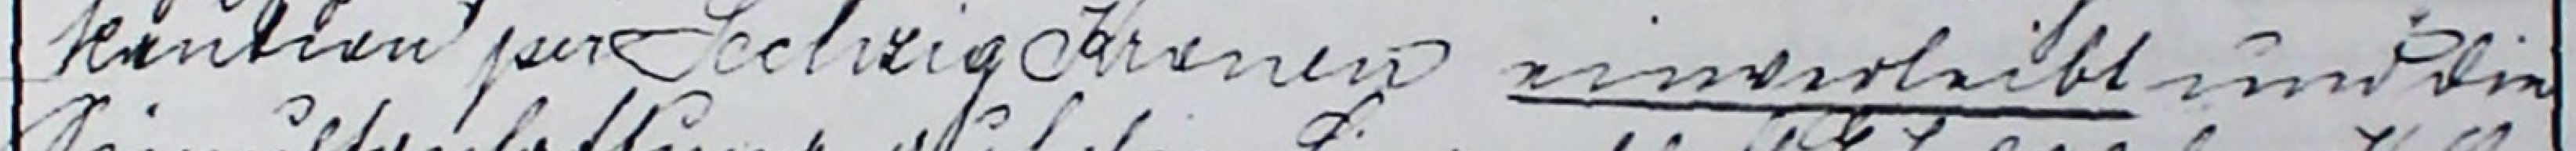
Kaution per Sechzig Kronen einverleibt und die
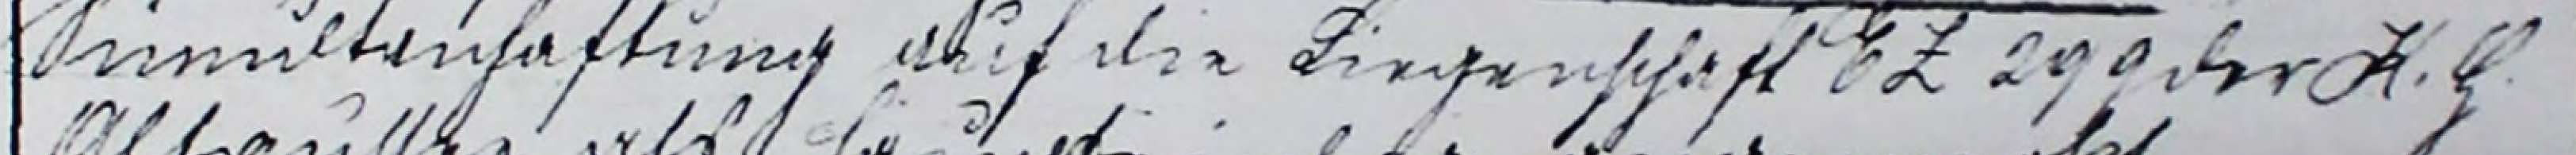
Simultanhaftung auf die Liegenschaft E Z 299 der K.G.
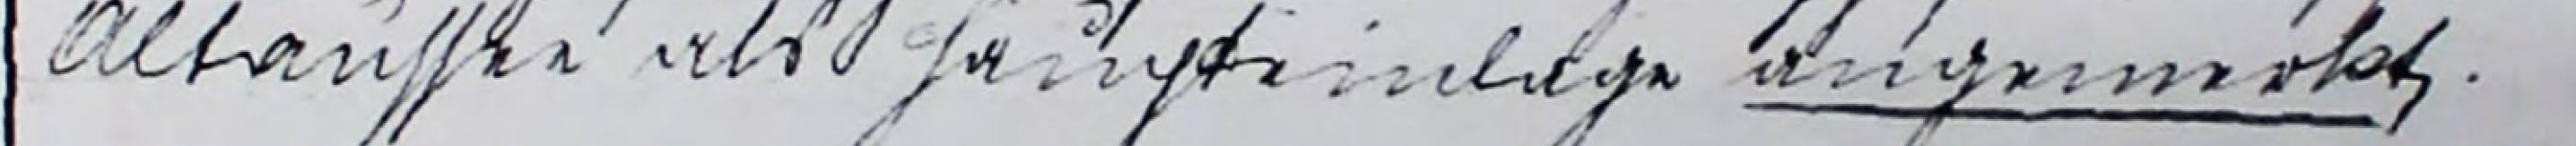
Altaussee als Haupteinlage angemerkt.
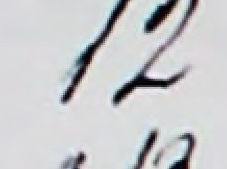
12
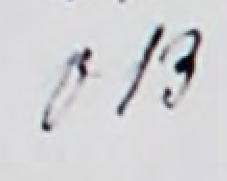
s 13
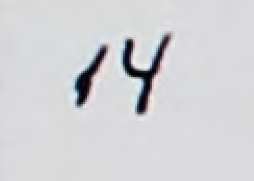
14
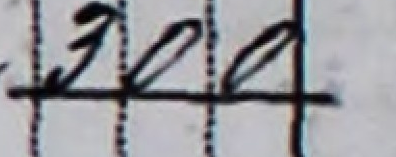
300
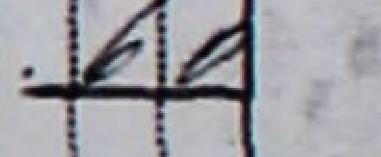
60
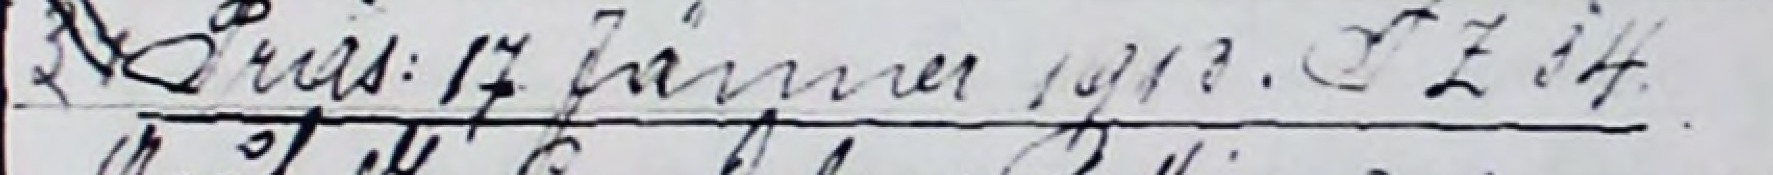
31 Präs: 17. Jänner 1913. T Z 34.
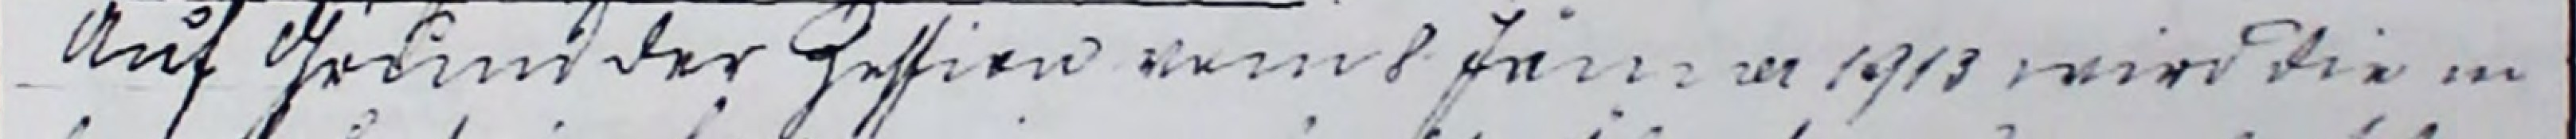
Auf Grund der Zession vom 8. Jänner 1913 wird die in
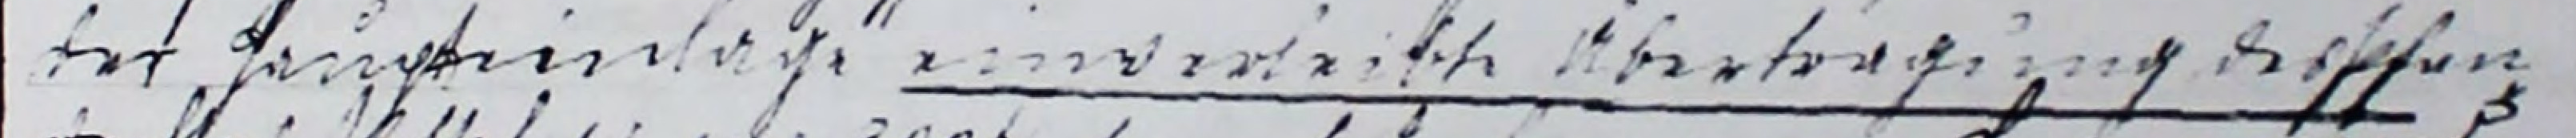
der Haupteinlage einverleibte Übertragung des Pfan„
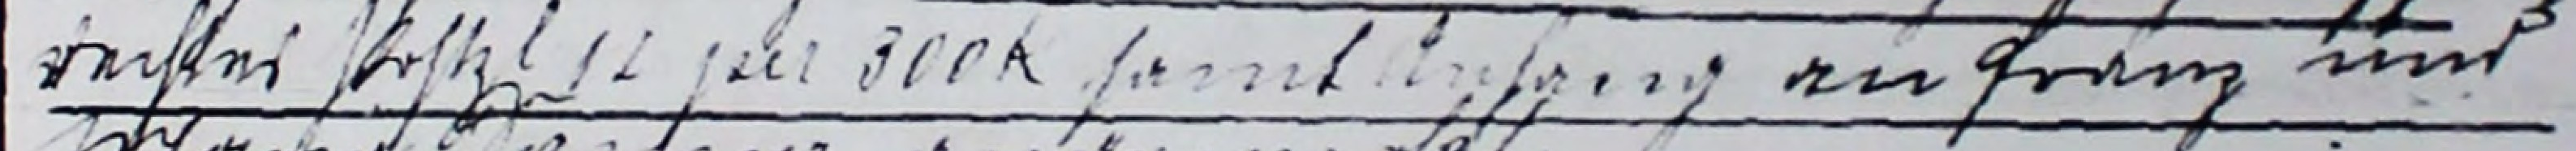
drechtes Postzl 12 per 300 K samt Anhang den Franz und
